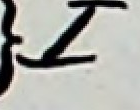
I
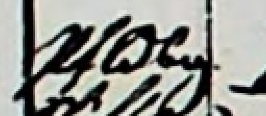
Pfldsg.
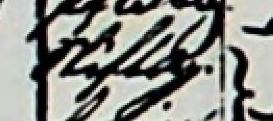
Stiftsg.
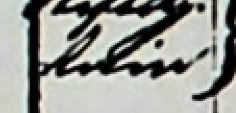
Rain
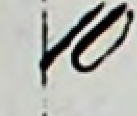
10
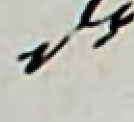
do
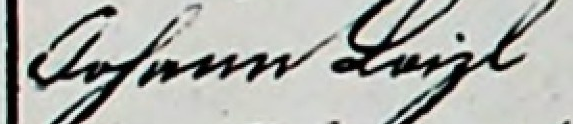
Johann Loizl
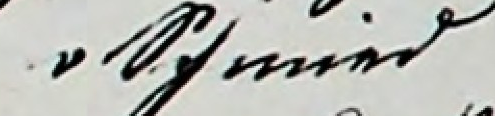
v. Schmied
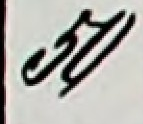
50
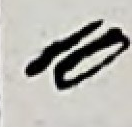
10
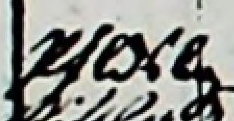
Pfldsbg.
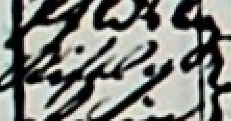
Stiftsg.
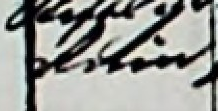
Rain
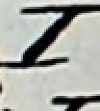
I
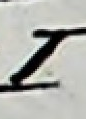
I
